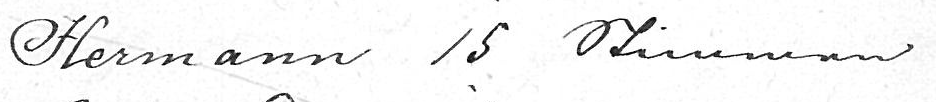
Hermann 15 Stimmen
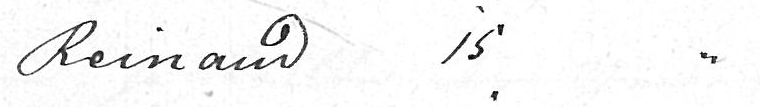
Reinaud 15 "
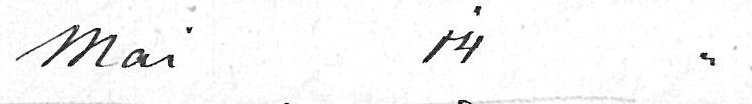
Mai 14 "
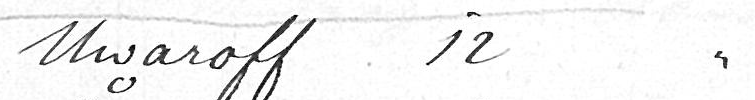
Uwaroff 12 "
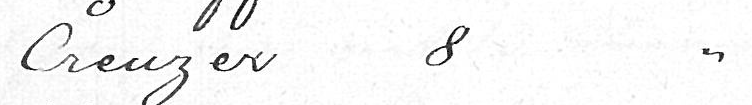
Creuzer 8 "
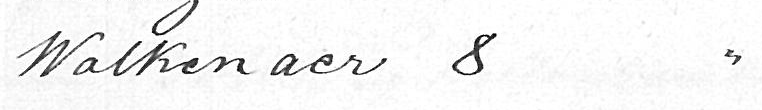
Walkenaer 8 "
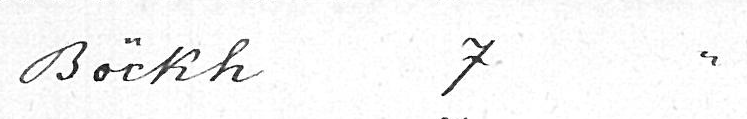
Böckh 7 "
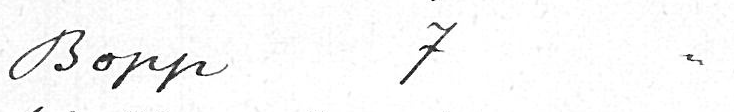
Bopp 7 "
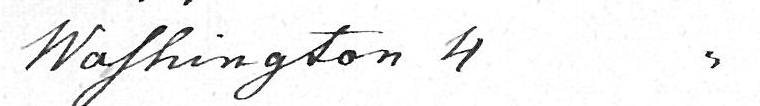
Washington 4 "
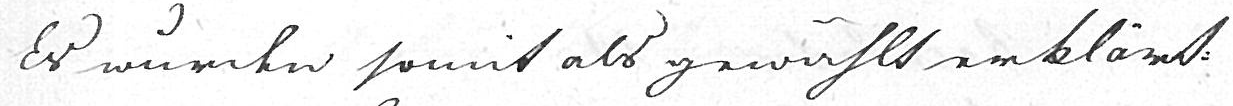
Es wurden somit als gewählt erklärt:
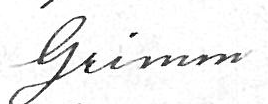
Grimm
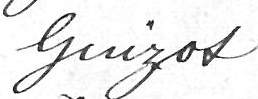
Guizot
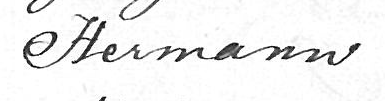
Hermann
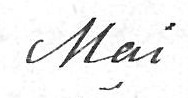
Mai
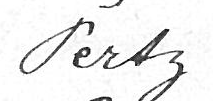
Pertz
